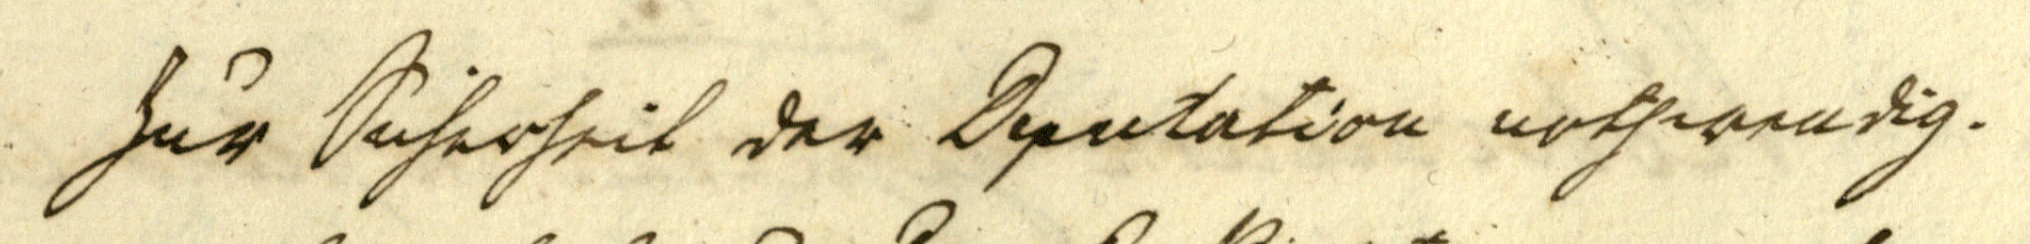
zur Sicherheit der Deputation nothwendig.
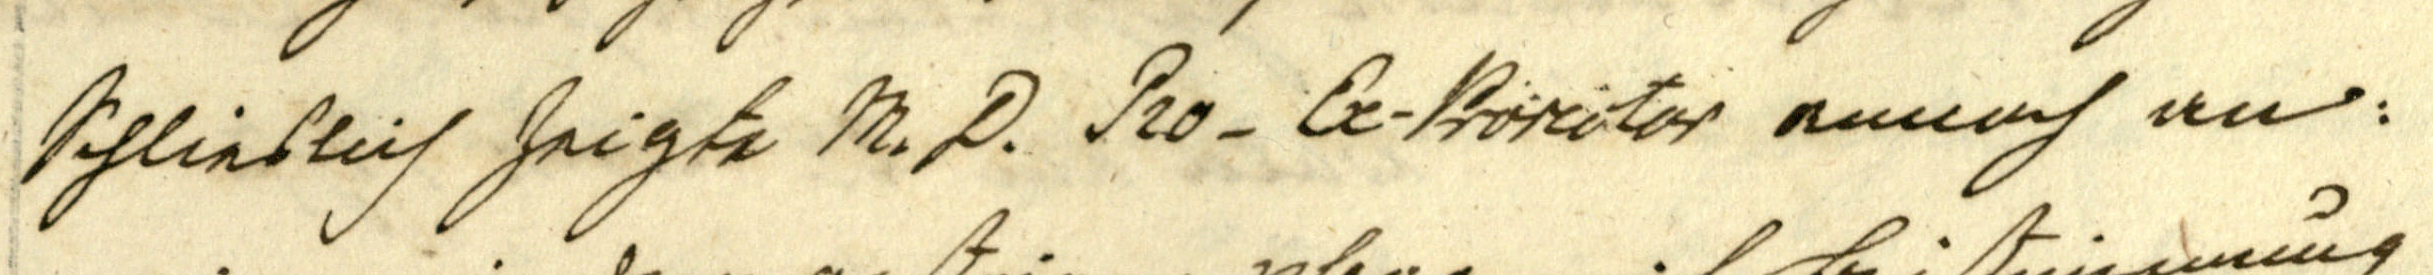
Schlieslich zeigte M. D. Pro. Ex Prorector annoch an:
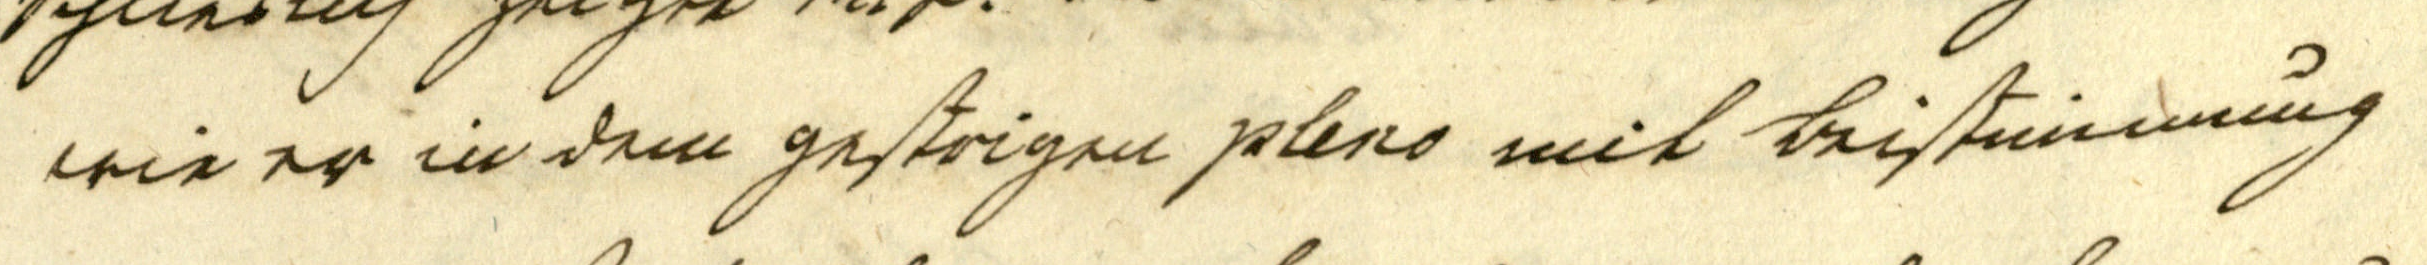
wie er in dem gestrigen pleno mit Beistimmung
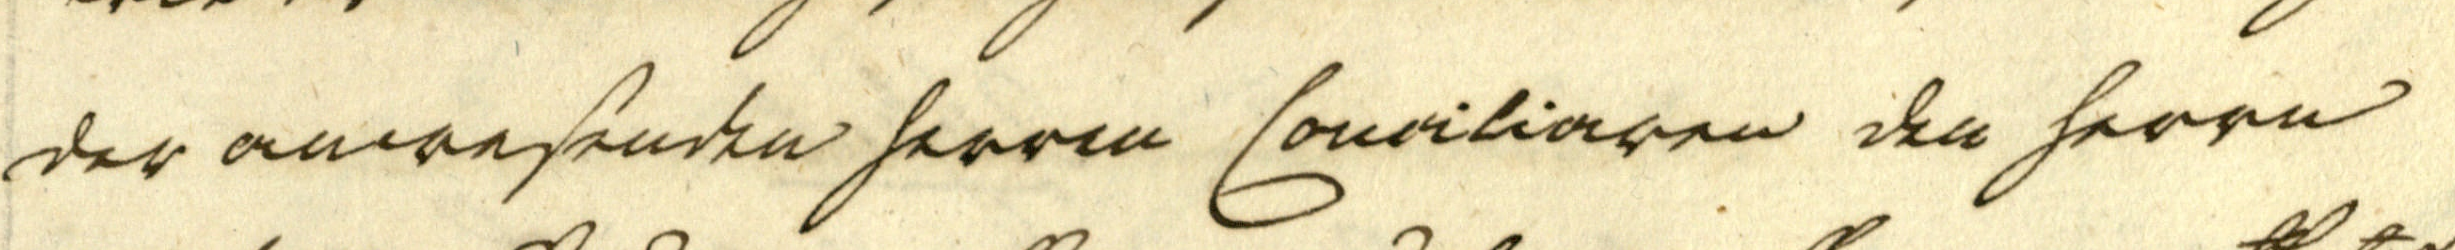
der anwesenden Herren Conciliaren den Herrn
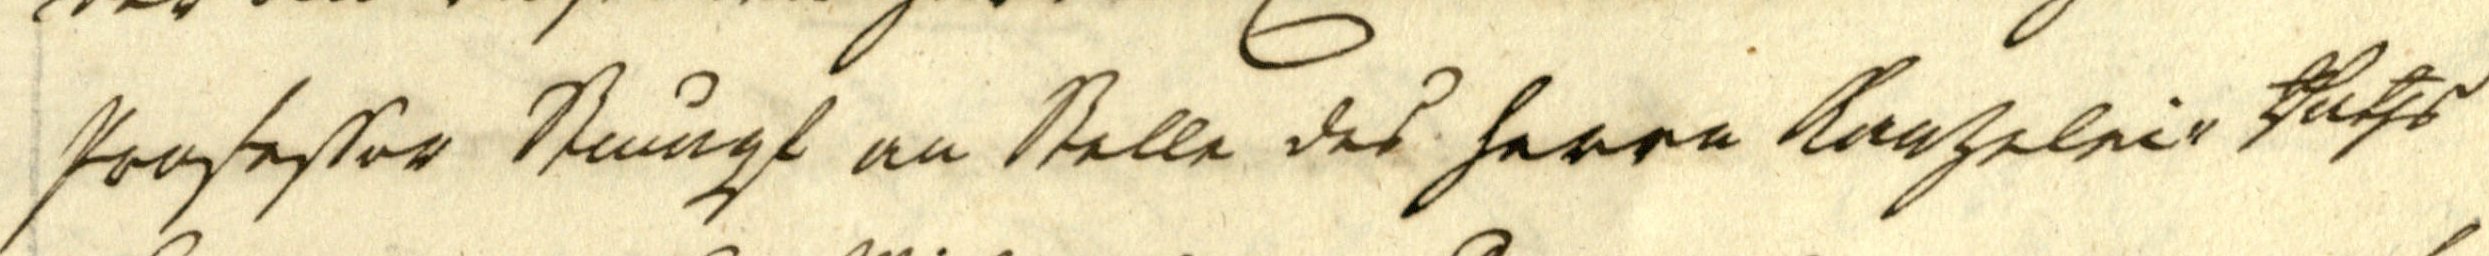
Professor Stumpf an Stelle des Herrn Kanzelei Raths
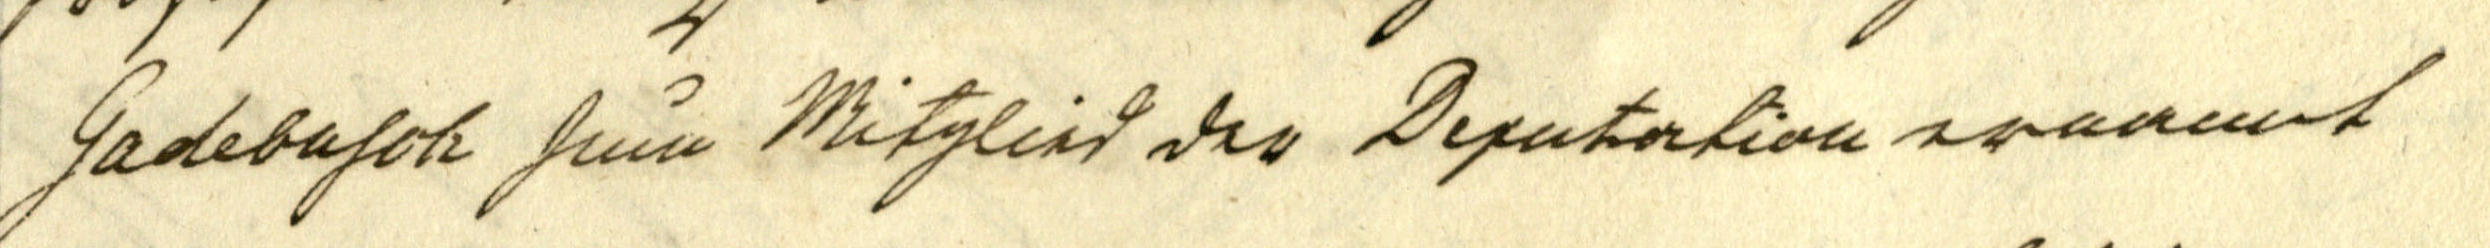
Gadebusch zum Mitglied der Deputation ernannt
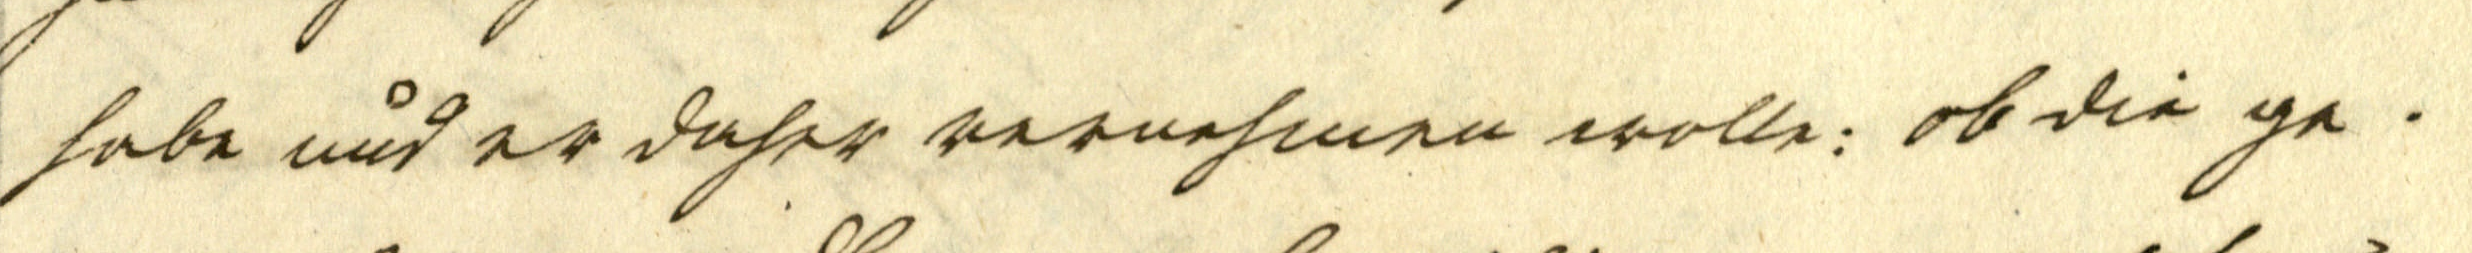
habe und er daher vernehmen wolle: ob die ge¬
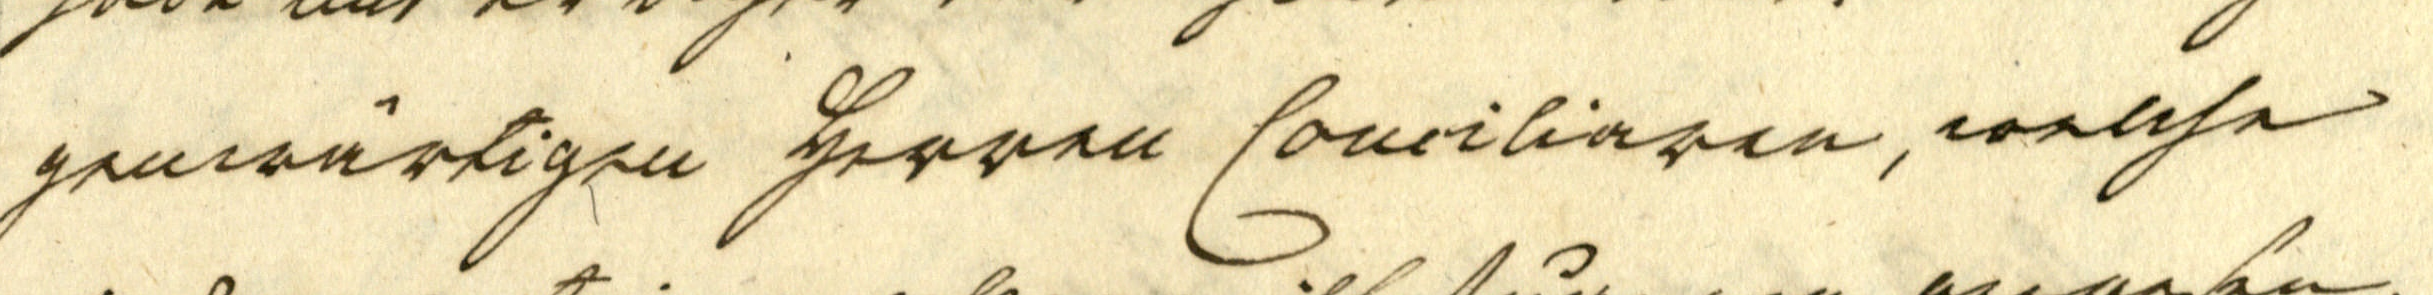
genwärtigen Herren Conciliaren, welche
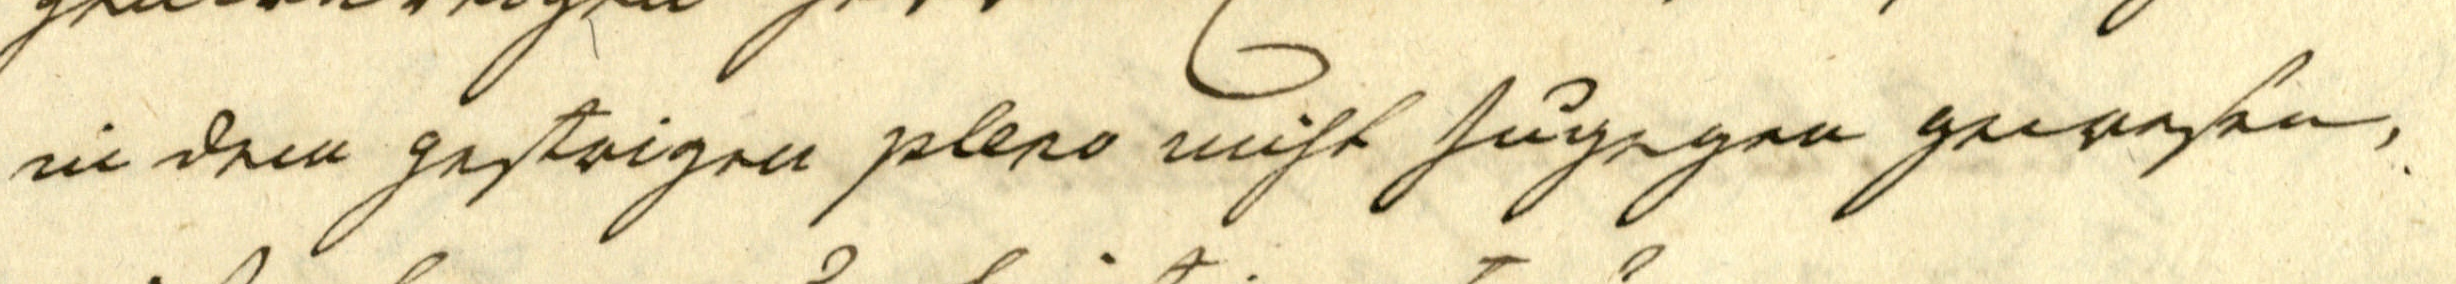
in dem gestrigen pleno nicht zugegen gewesen,
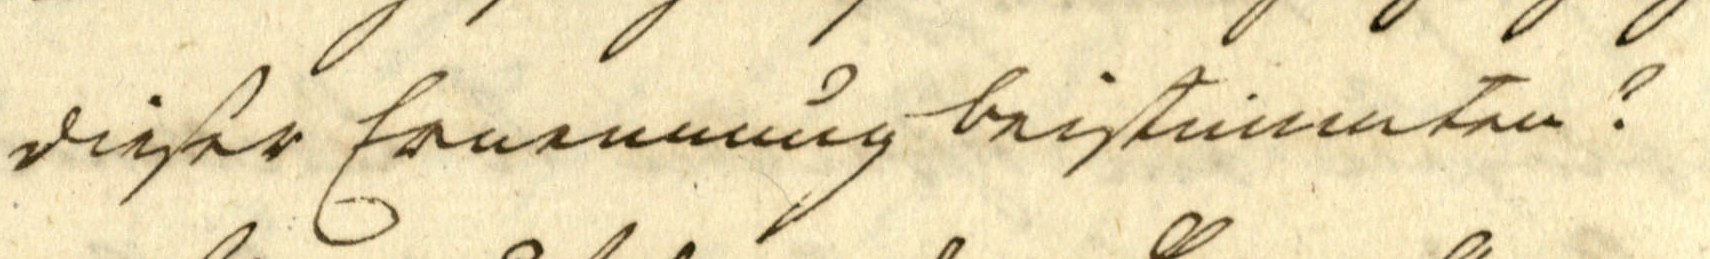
dieser Ernennung beistimmten?
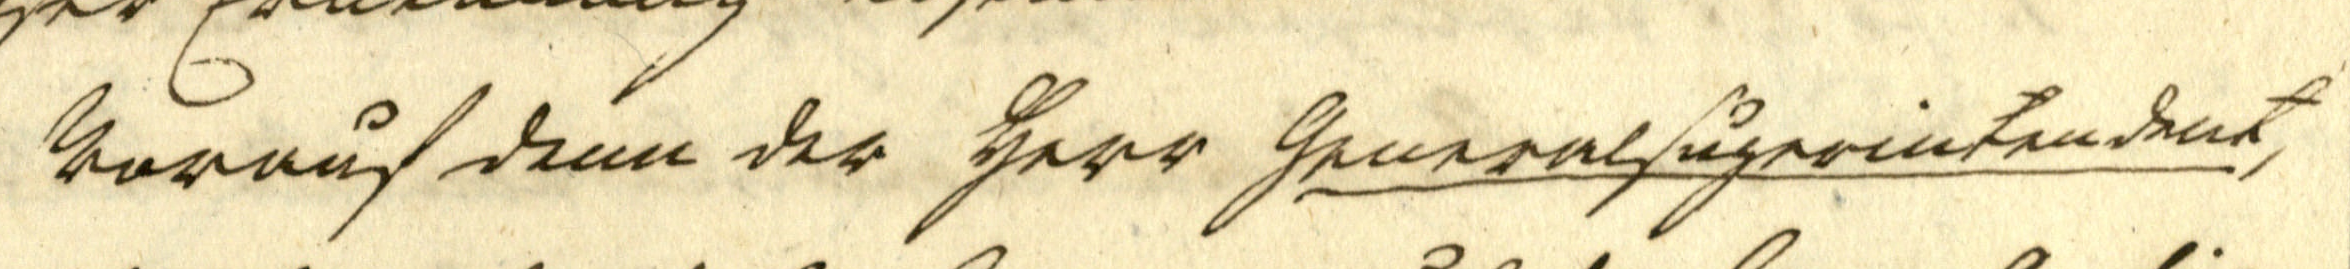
Worauf denn der Herr Generalsuperintendent,
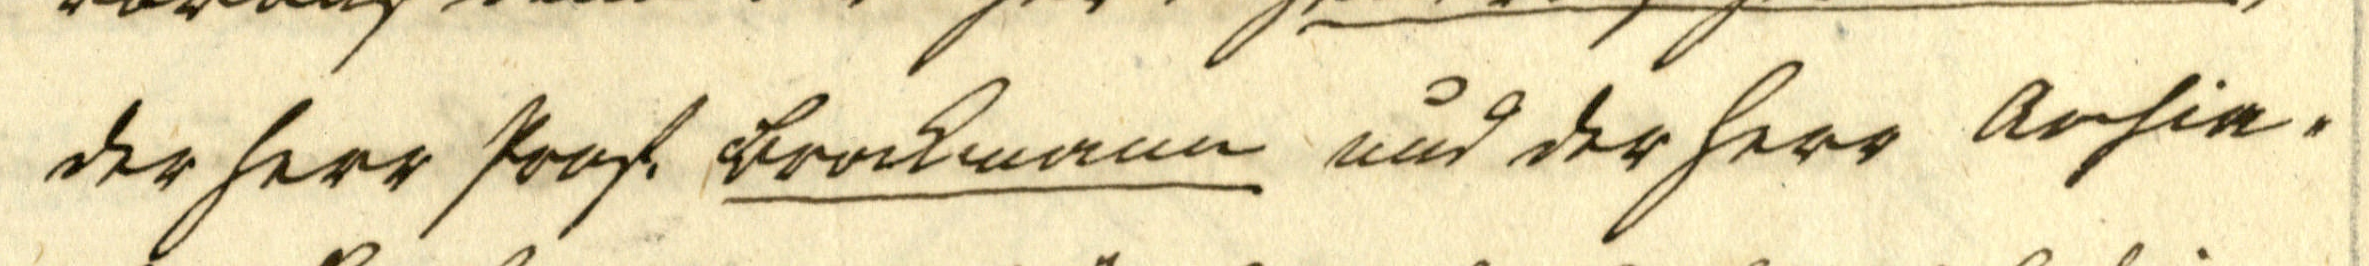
der Herr Prof. Brockmann und der Herr Archia¬
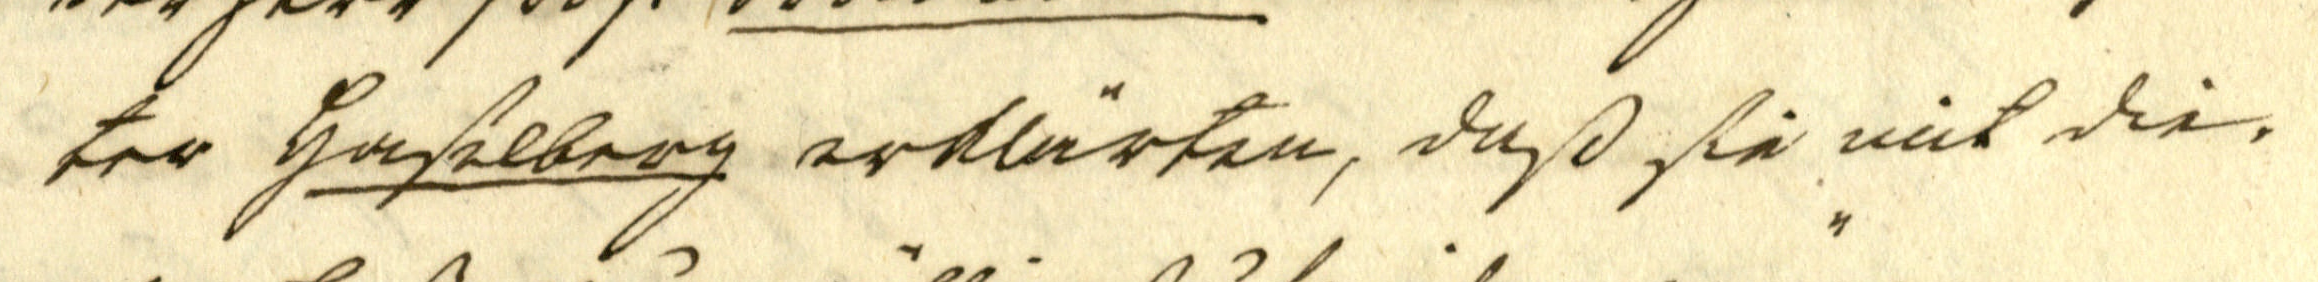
ter Haselberg erklärten, daß sie mit die¬
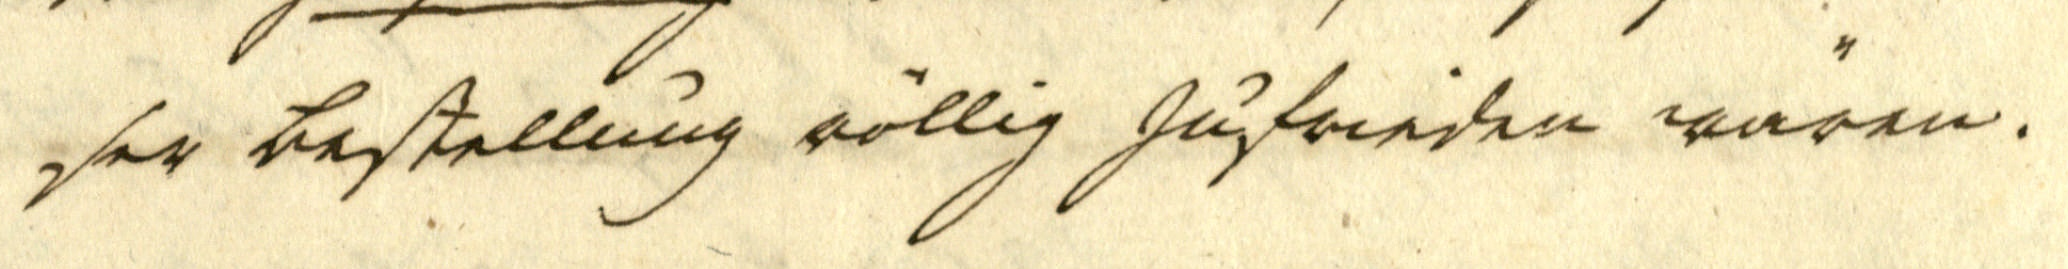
ser Bestellung völlig zufrieden wären.
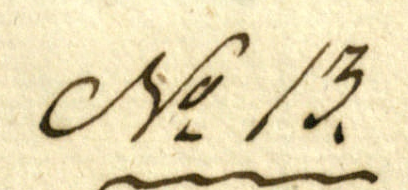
No 13.
